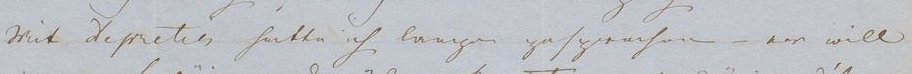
Mit Depretis hatte ich lange gesprochen – er will
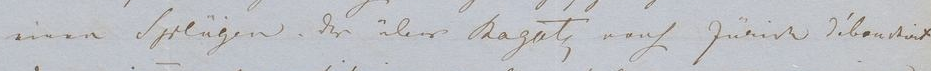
einen Splügen – der über Ragatz nach Zürich débouchirt
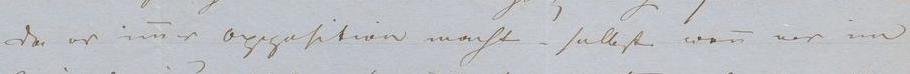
da er immer Opposition macht – selbst wenn er im
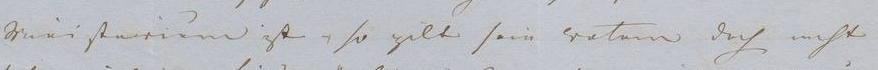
Ministerium ist – so gilt sein votum doch nicht
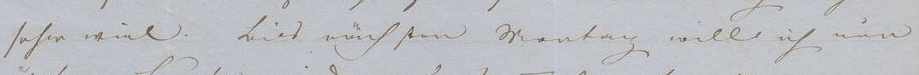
sehr viel. Bis nächsten Montag will ich nun
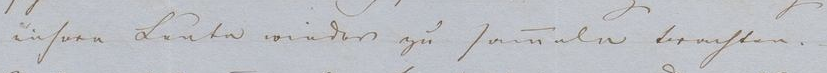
unsere Leute wieder zu sammeln trachten.
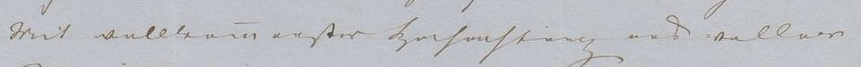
Mit vollkommenster Hochachtung und voller
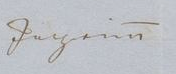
Ingrimm
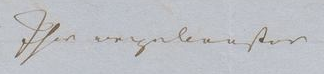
Ihr ergebenster
